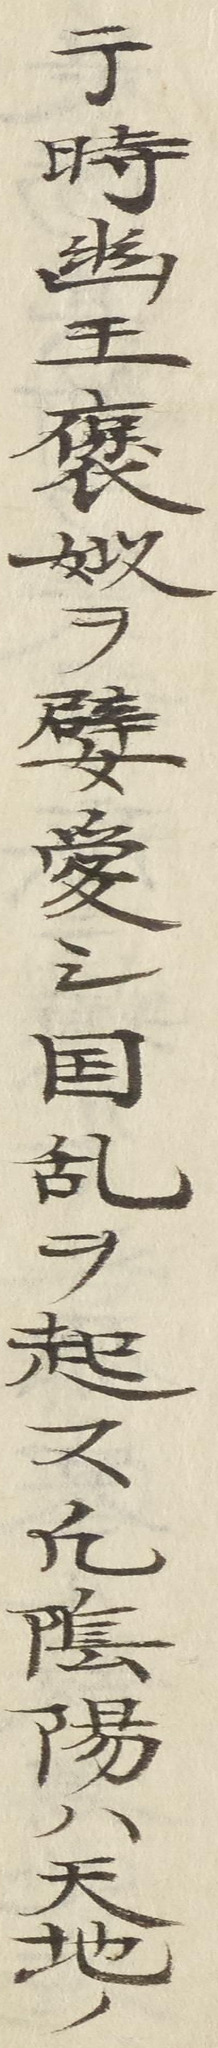于時幽王褒姒を嬖愛し国乱を起す凡陰陽は天地の
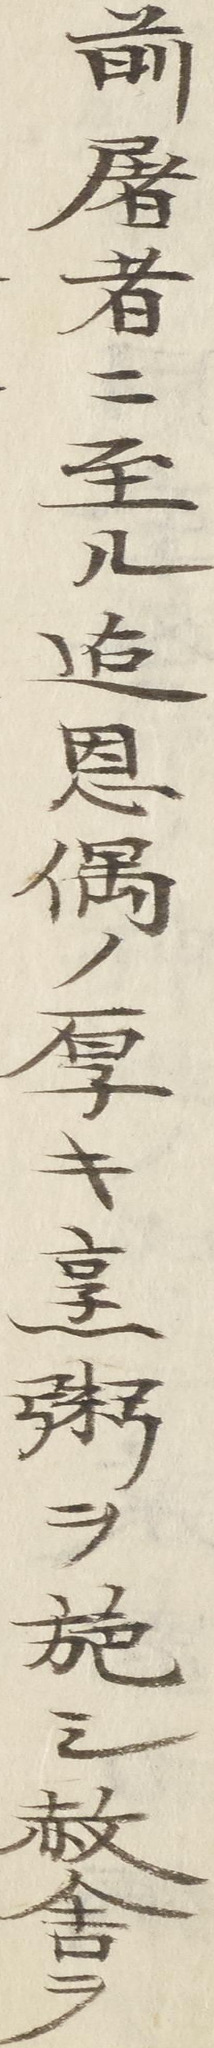前屠者に至る迄恩偶の厚き烹粥を施し赦舎を
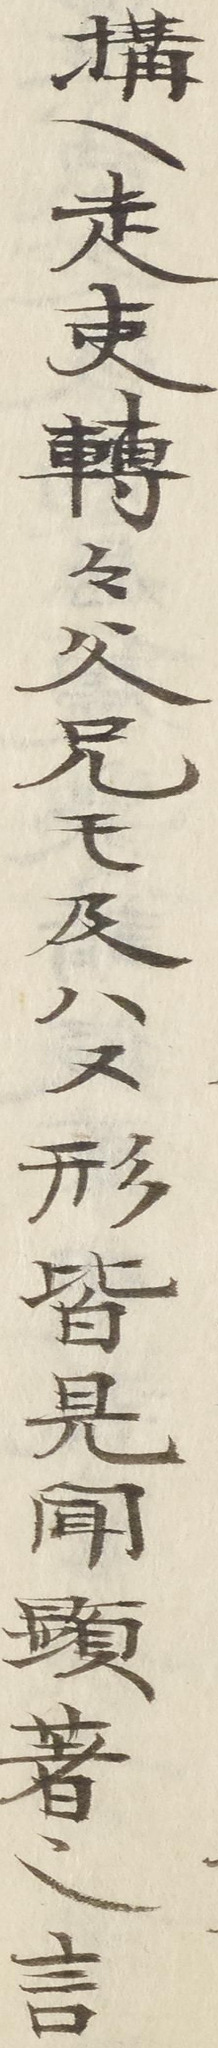構へ走吏転々父兄も及はぬ形皆見聞顕著也言
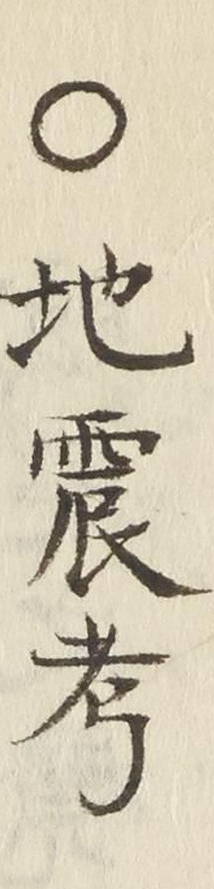◯地震考
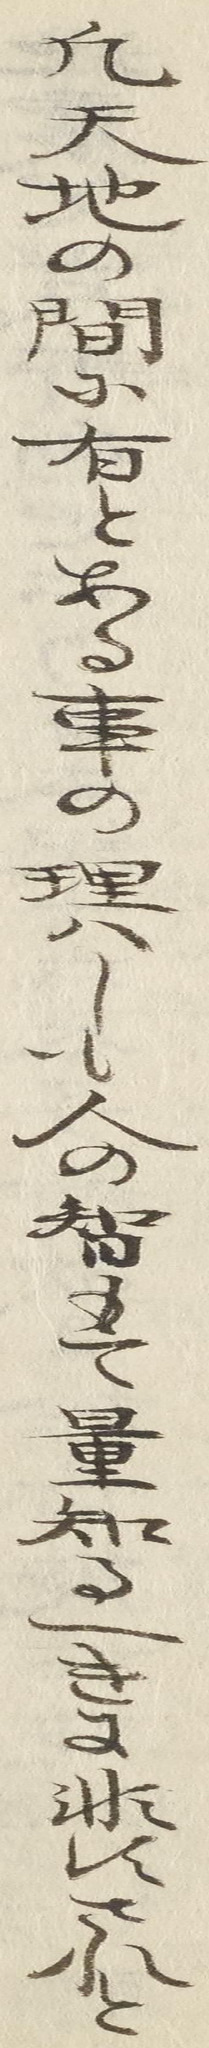凡天地の間に有とある事の理はしも人の智にて量知るへきに非すされと
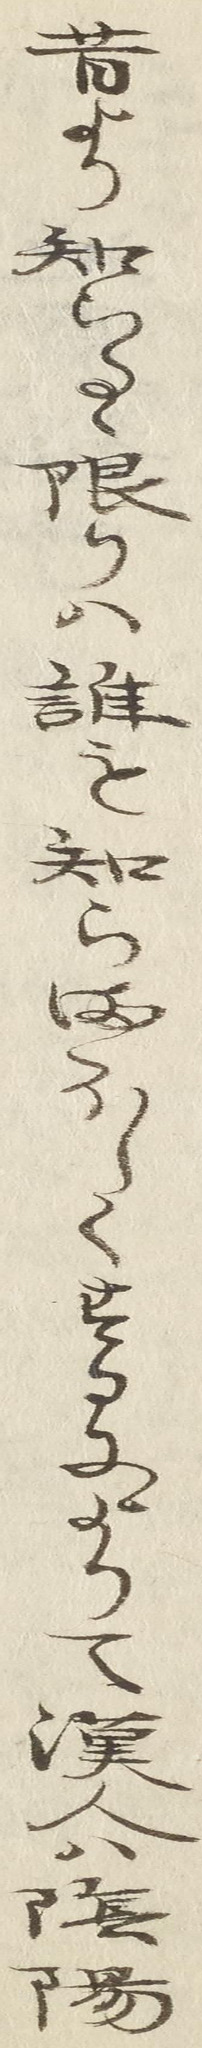昔より知らるゝ限りは誰も知らまほしくするによりて漢人は陰陽
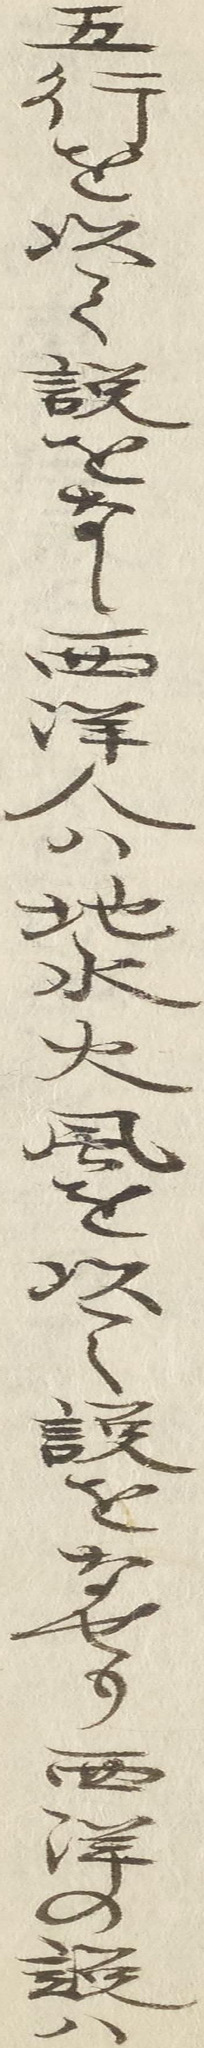五行を以て説をなし西洋人は地水火風を以て説をなせり西洋の説は
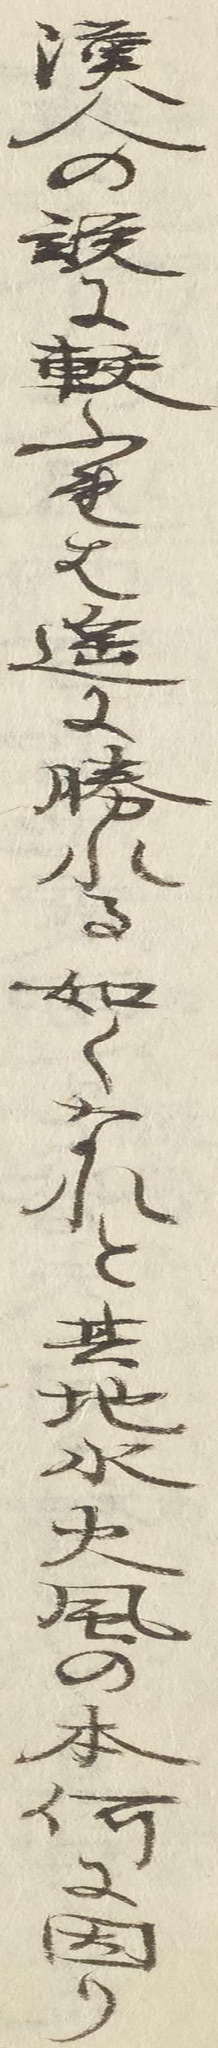漢人の説に較ふれは遥に勝れる如くなれと其地水火風の本何に因り
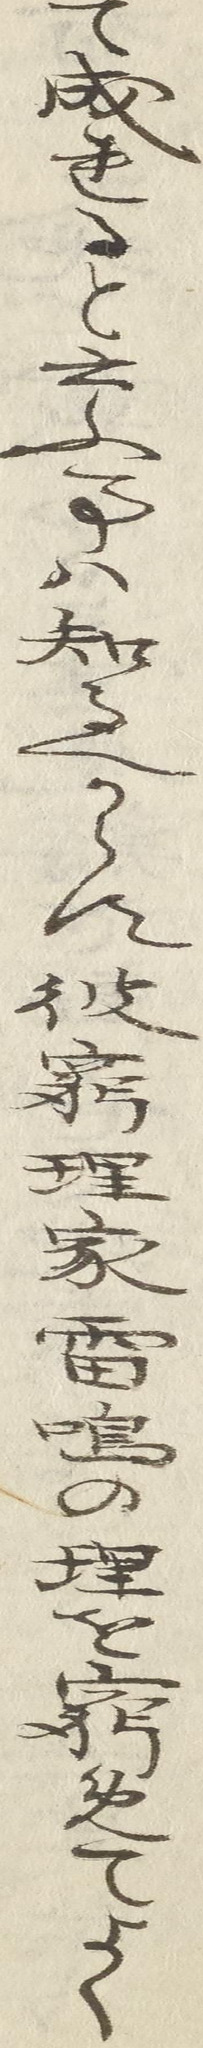て成すると云ふ事は知るへからす彼窮理家雷鳴の理を窮めてよく
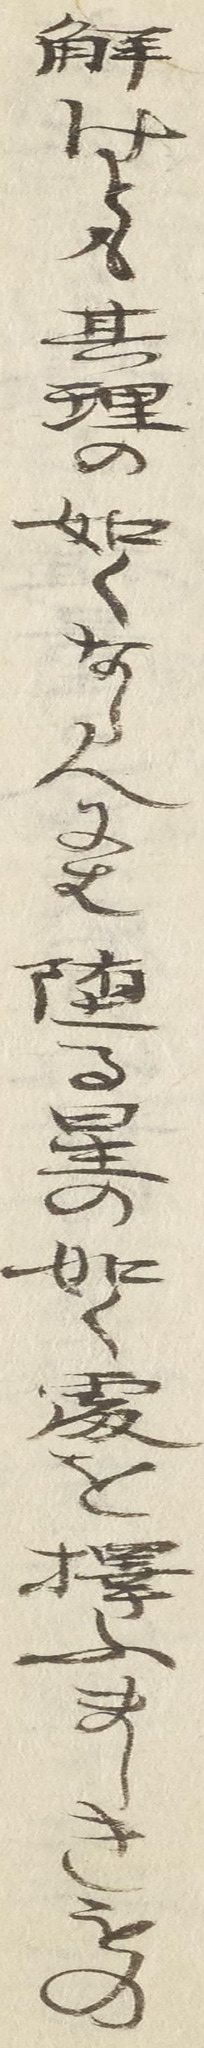解けとも其理の如くならんには堕る星の如く処を擇ふましきもの
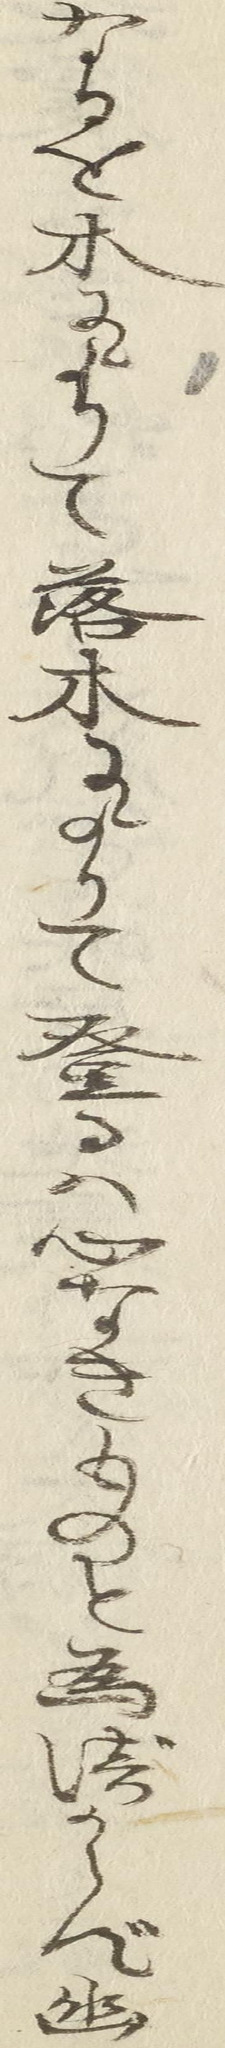なるを木によりて落木によりて登るは心なきものと為づかしで幽
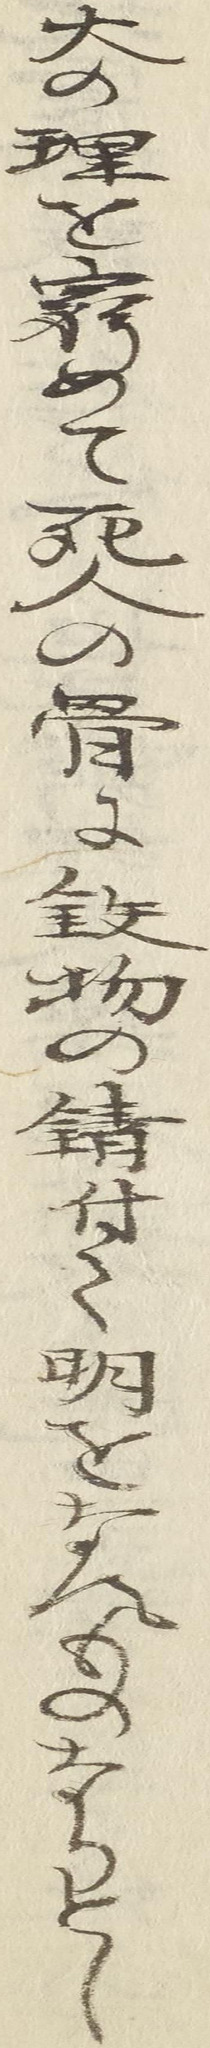火の理を窮めて死人の骨に鉄物の錆付て明をなすものなりとし
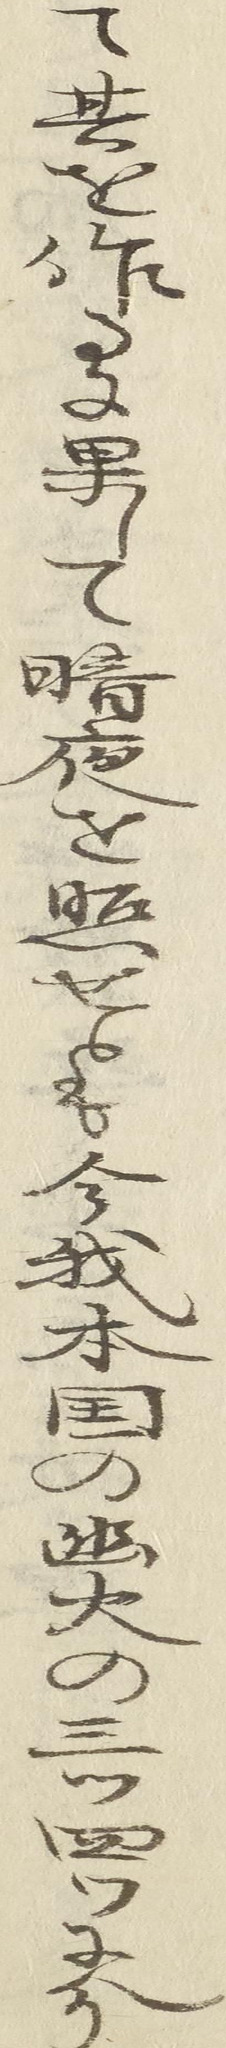て其を作るに果して暗夜を照せとも今我本国の幽火の三ッ四ッに分

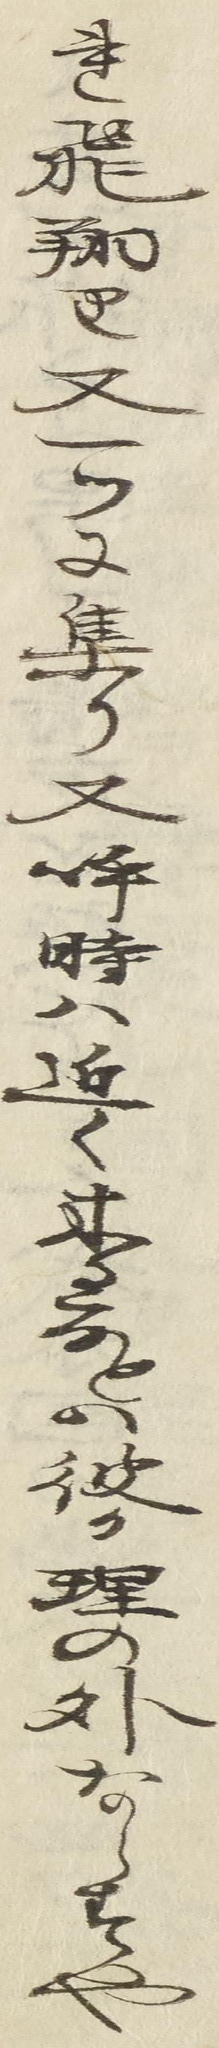れ飛翔り又一ッに集り又呼時は近く成るなとの彼か理の外なしはや
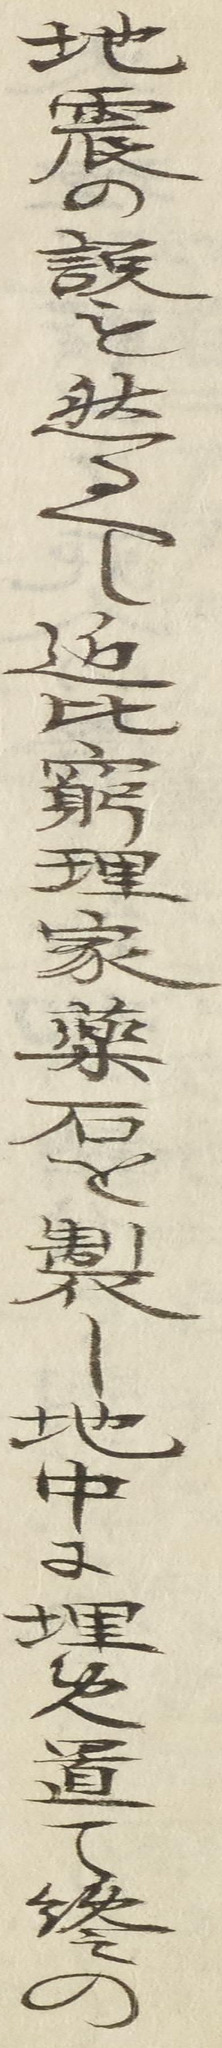地震の説も然るへし近比窮理家薬石を製し地中に埋め置て纔の
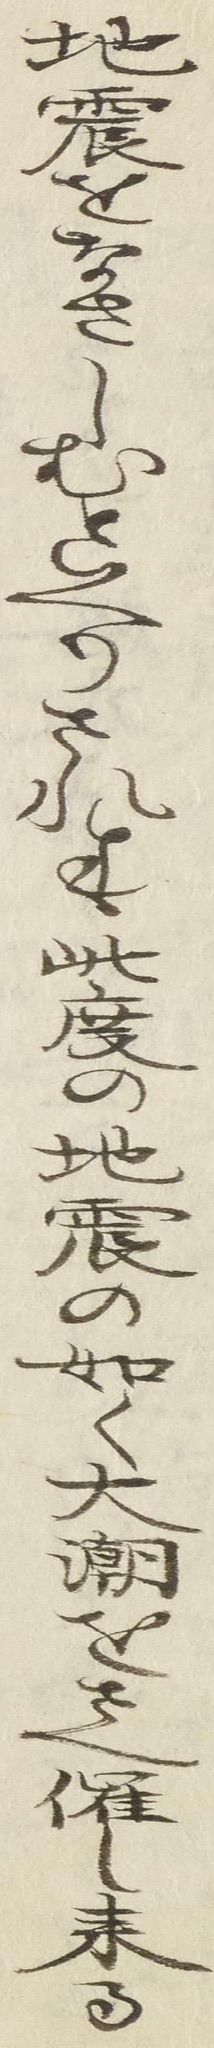地震をなさしむといへりされとも此度の地震の如く大潮をさへ催し来る
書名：地震記　下
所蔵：東京大学地震研究所図書室 Earthquake Research Institute Library, The University of Tokyo, JAPAN
